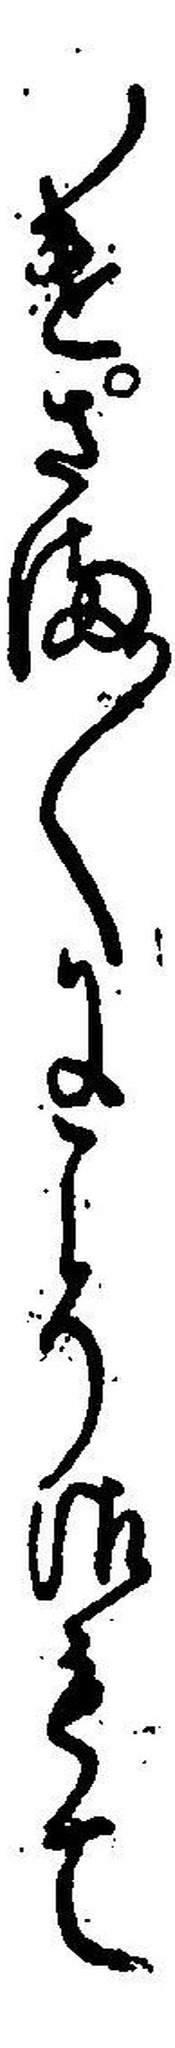つけさま〳〵にこそ御もて
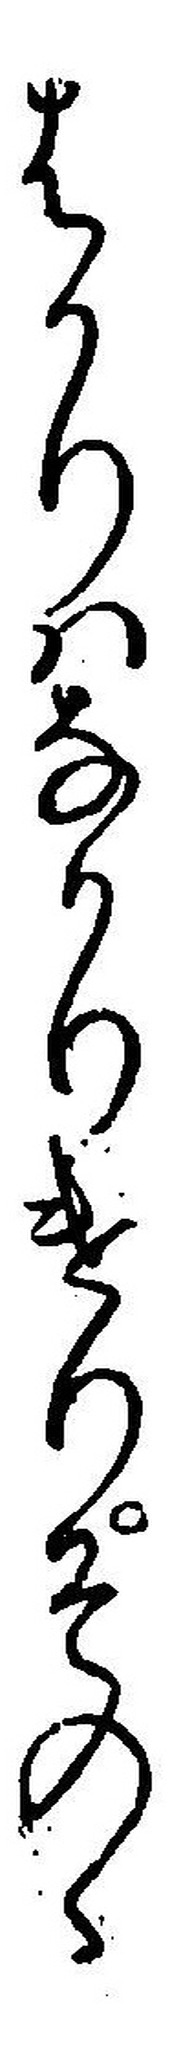はかりはなかりけり。そのゝ
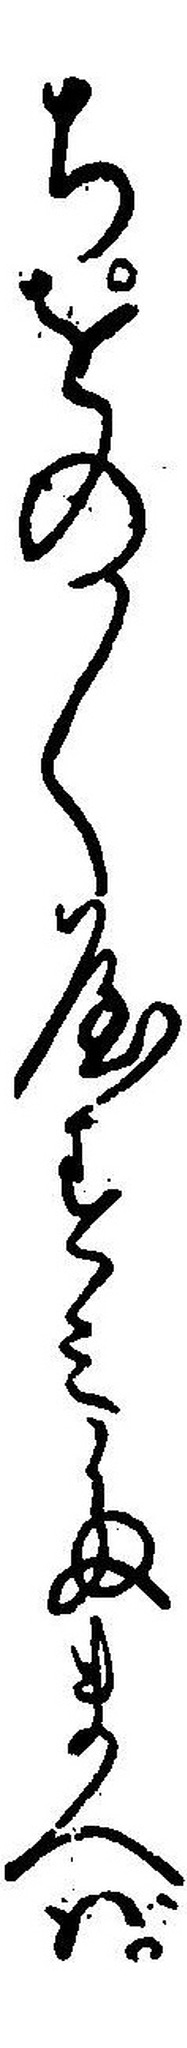ち。をの〳〵やすみたまへば。
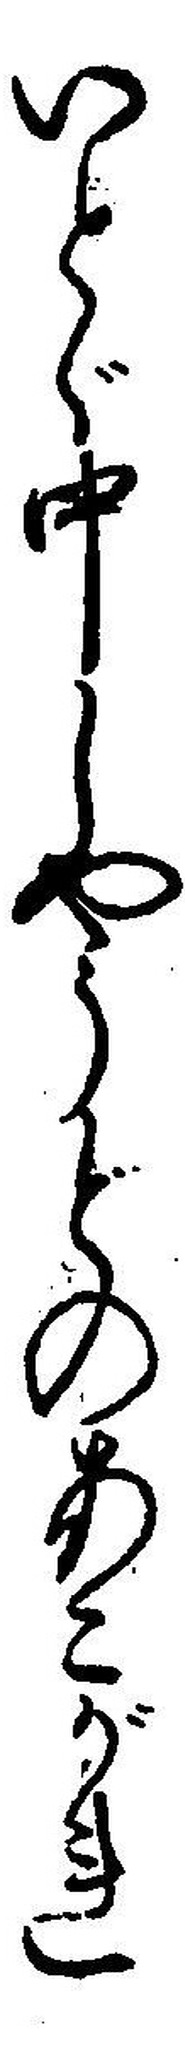いとゞ中しやうどのあこがれ
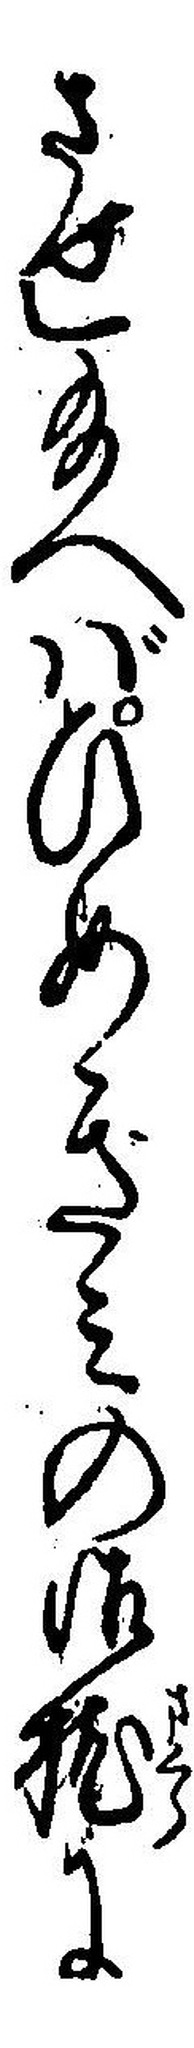させ給へば。ひめぎみの御枕に
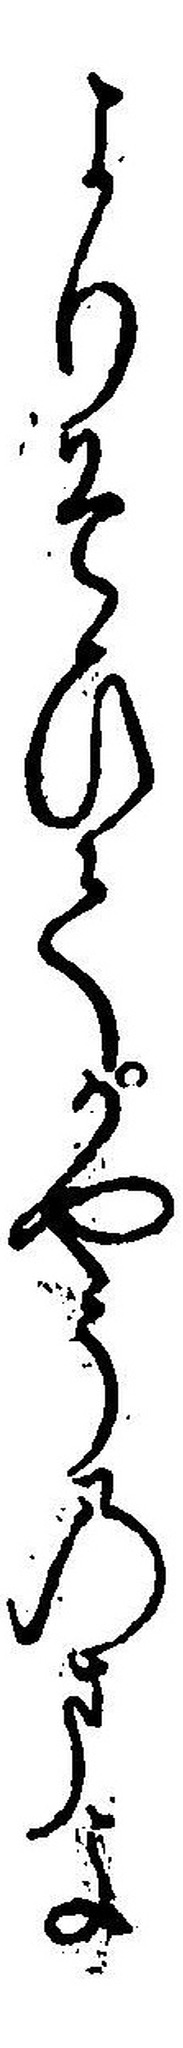よりそひて。かやうのまよ
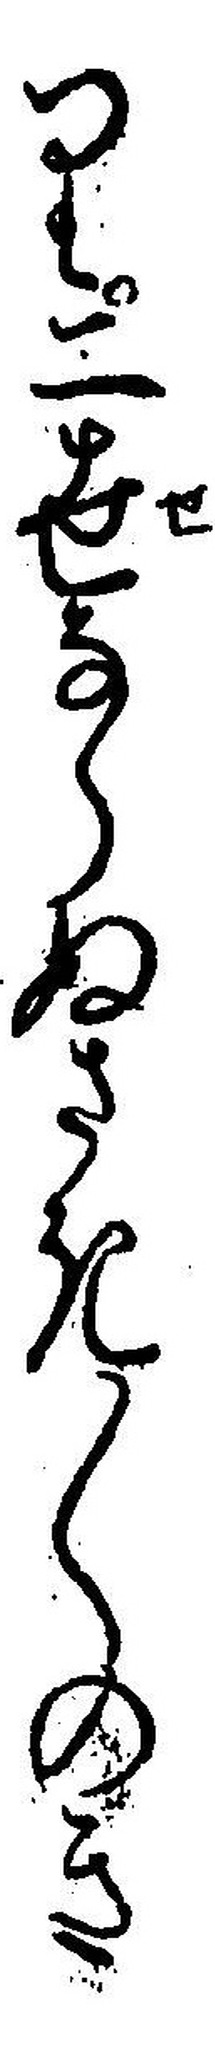り。二世ならぬさき〳〵のき
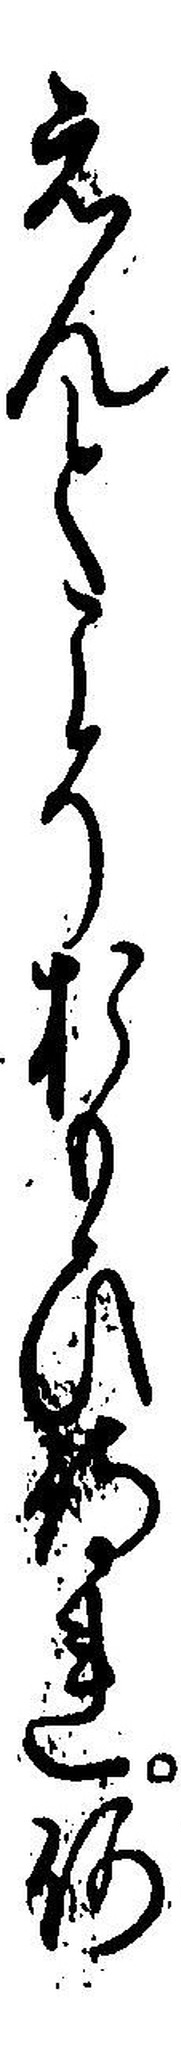えんとこそおもひ侍れ。何
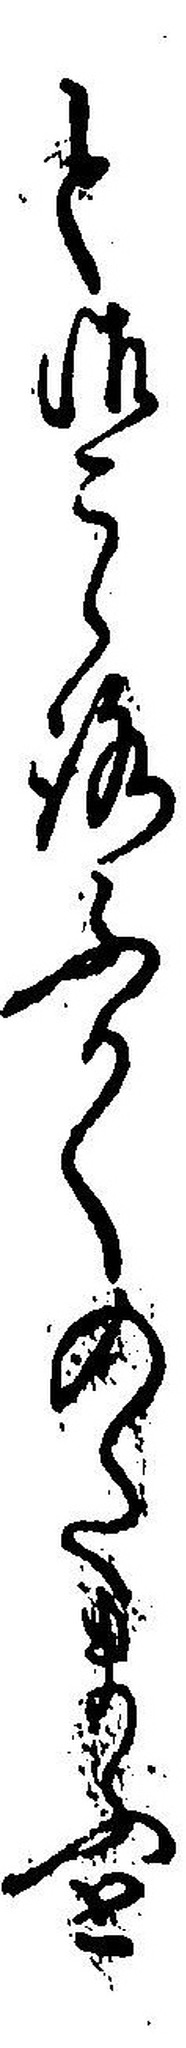と御こゝろふかくのたまふと
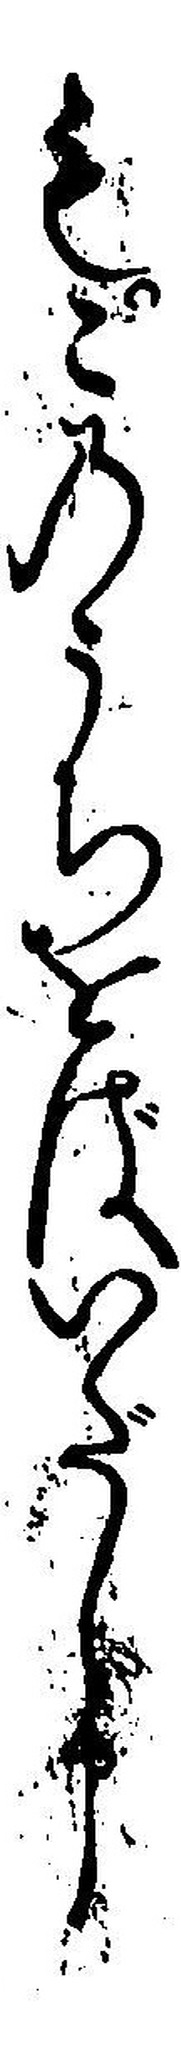も。このうちをばいだし申
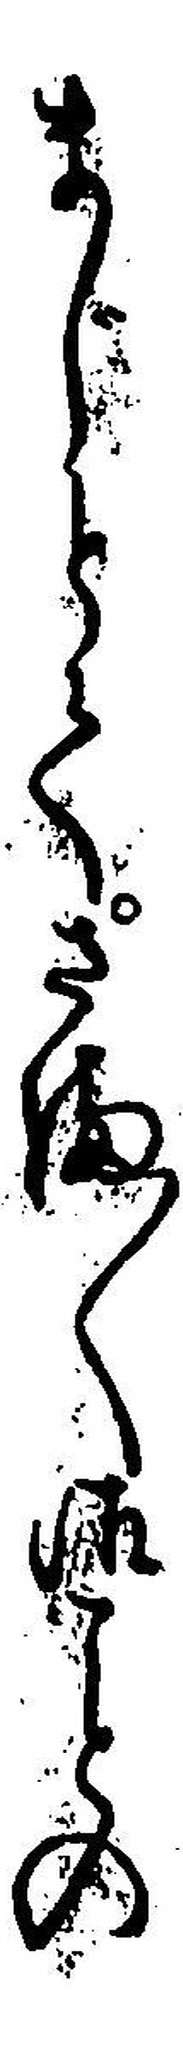まじとて。さま〳〵御ことの
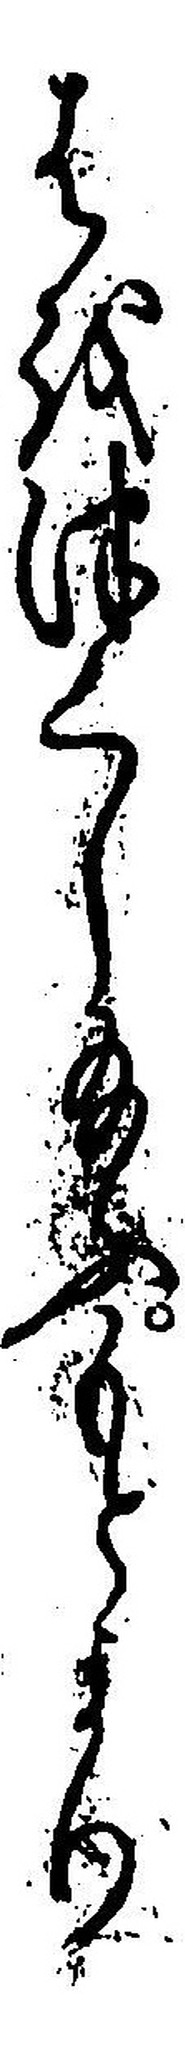はをつくし給ふ。もとより
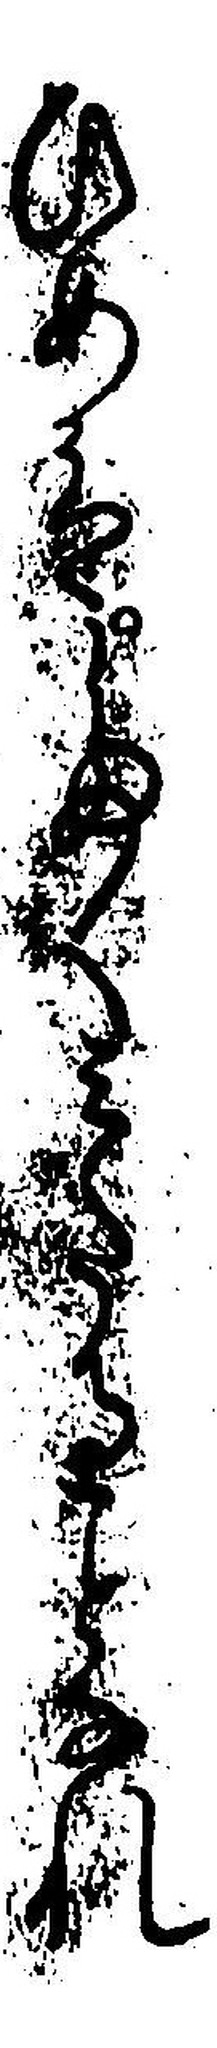ひめは。たくみたることなれ

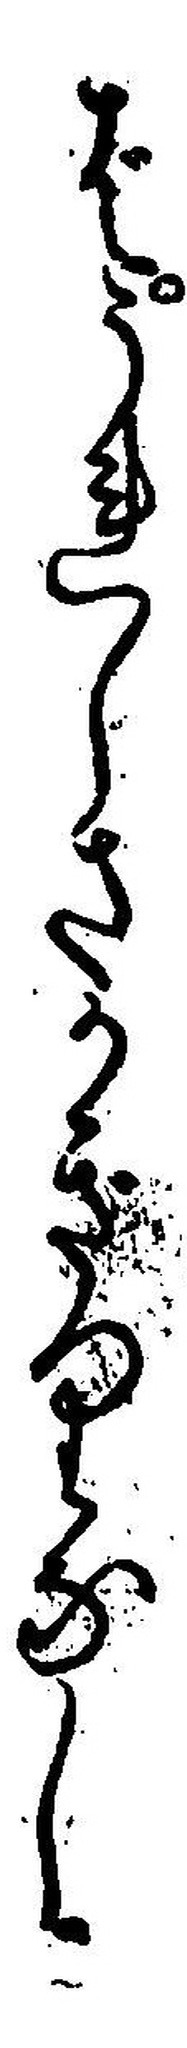ば。うれしさかぎりなし。
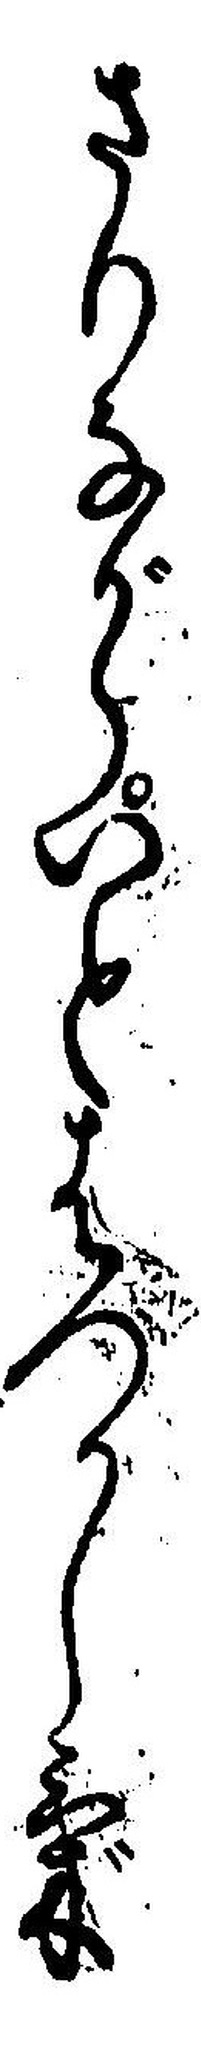さりながら。いとはつかしげ
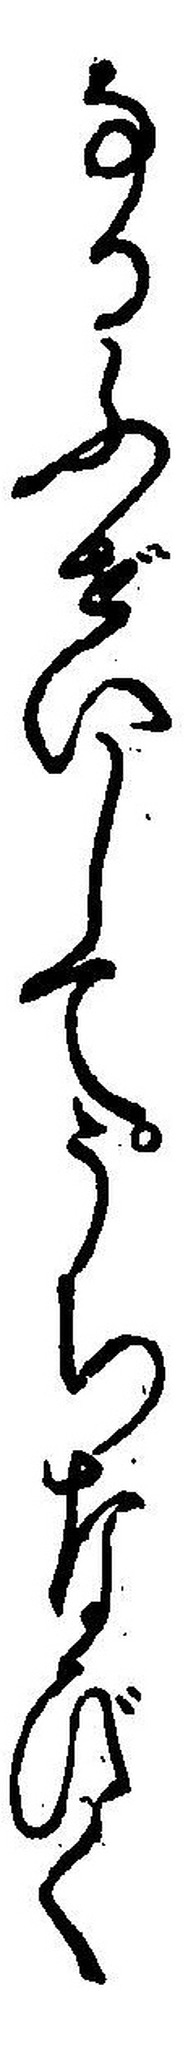なるふぜいして。うちなびく
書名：木幡きつね
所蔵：東京大学総合図書館 General Library in the University of Tokyo, JAPAN
